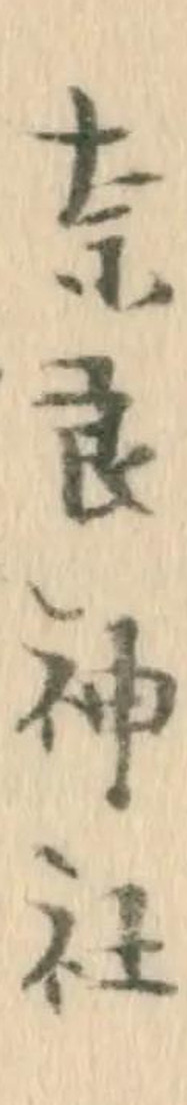奈良神社
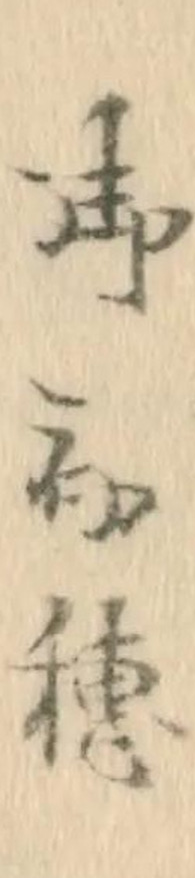御初穂

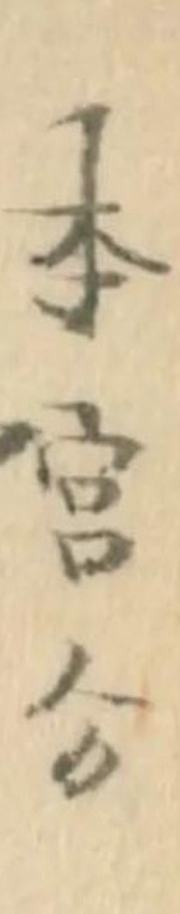本宮分
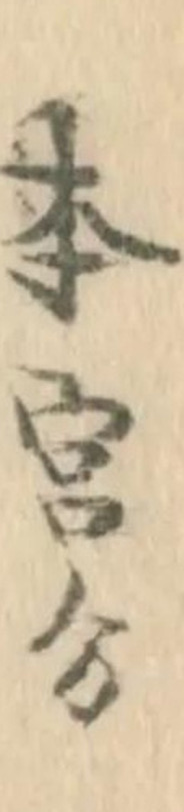本宮分
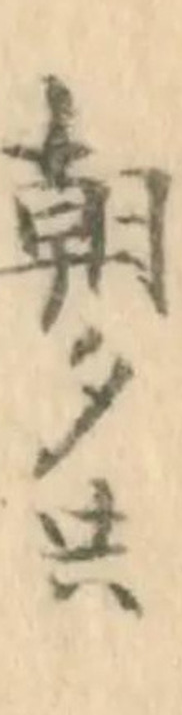朝夕共
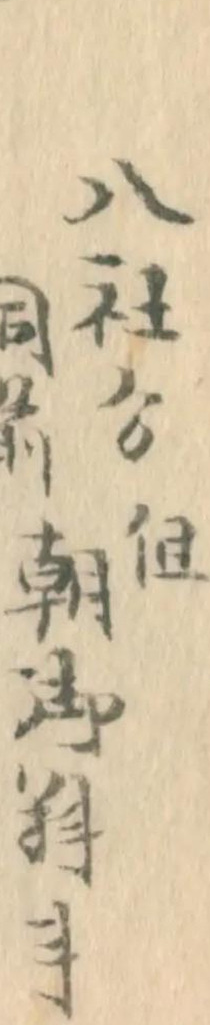八社分但朝御料斗
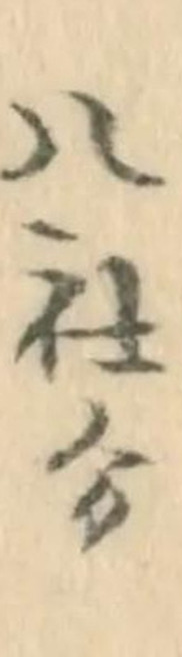八社分
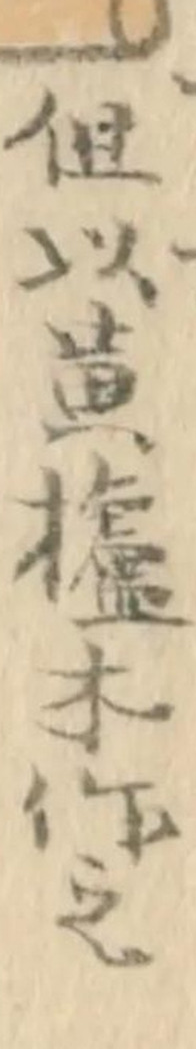但以黄櫨木作之
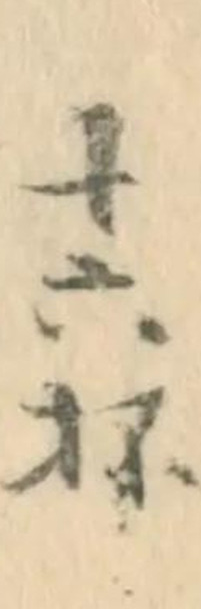十六杯
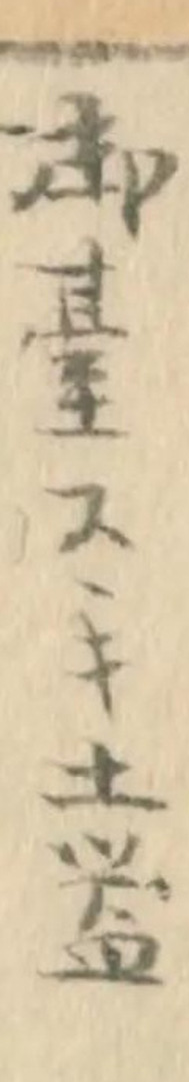御台スヽキ土器
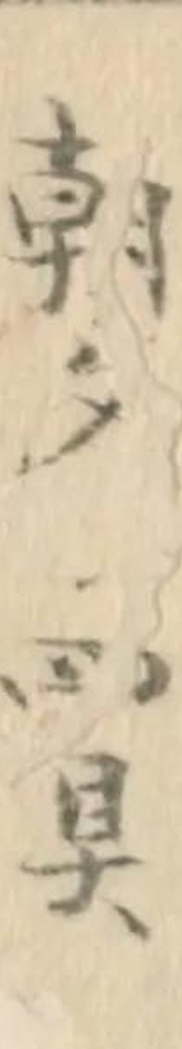朝夕四具
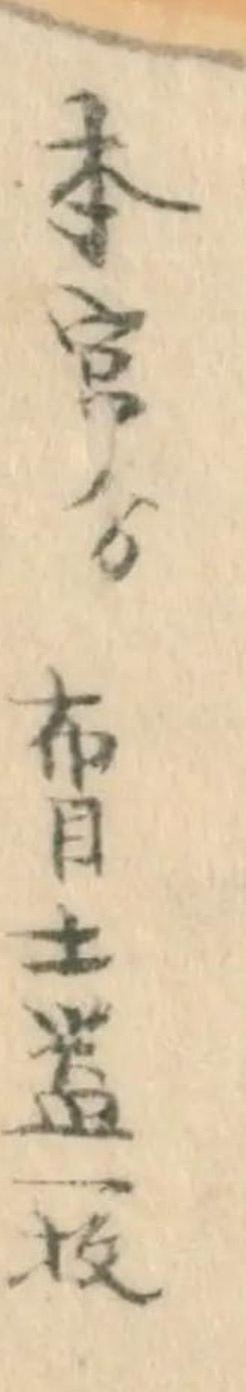本宮分布目土器一枚
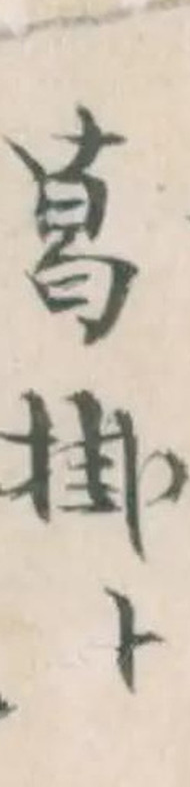葛掛ト
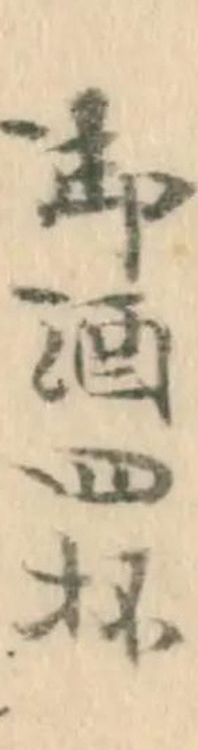御酒四杯
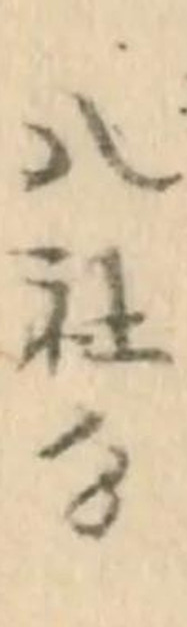八社分
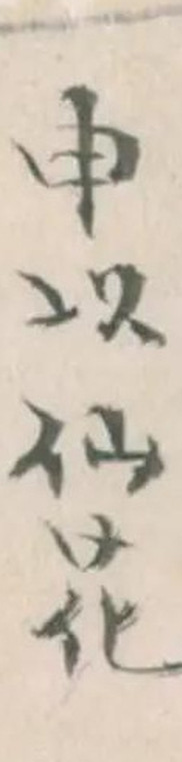申以仙花
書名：葵御祭供進之神饌諸品色目書
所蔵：国立国会図書館 National Diet Library, JAPAN
